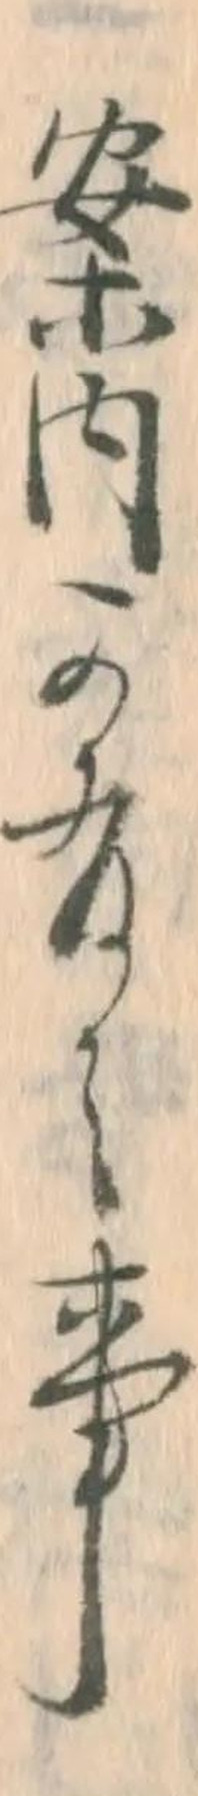案内可有之事
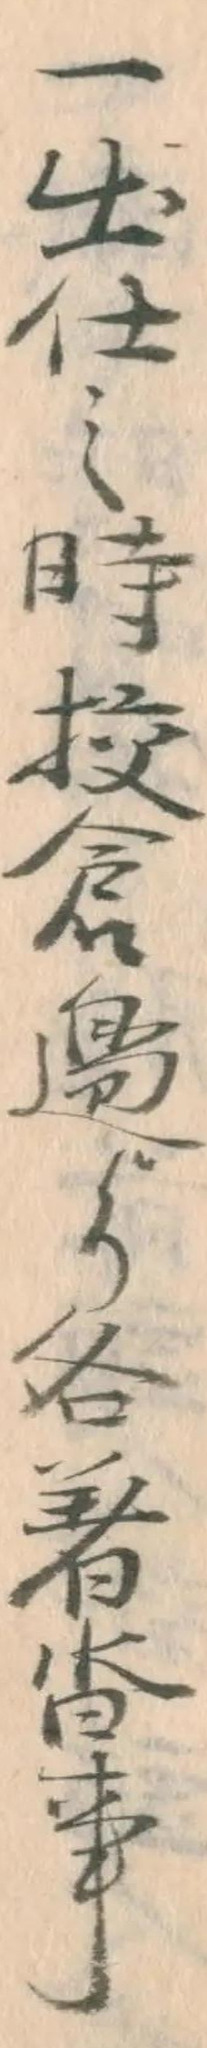一出仕之時校倉邊より各着沓事
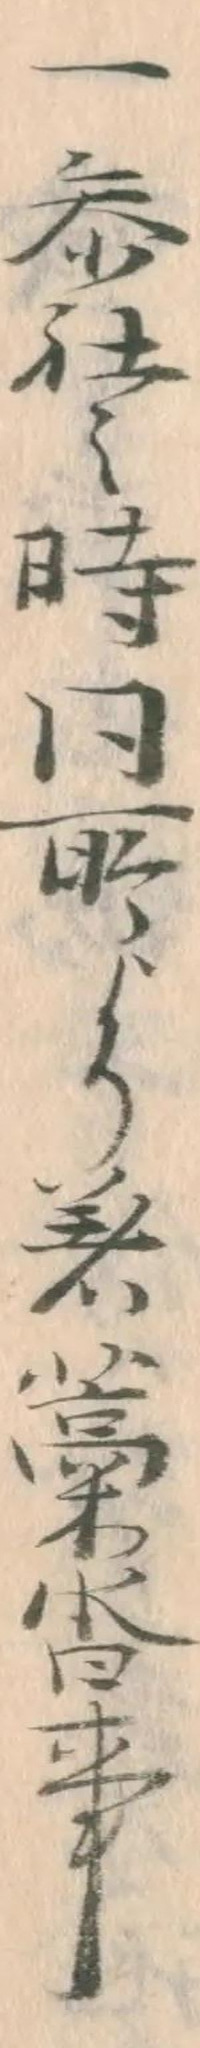一参社之時同所より着藁沓事
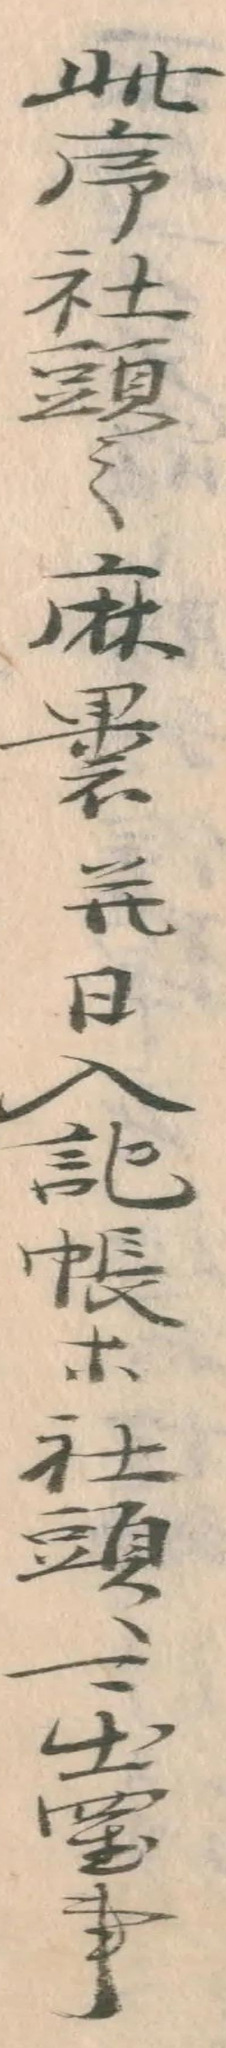此序社頭之麻包并日入記帳等社頭へ可出置事
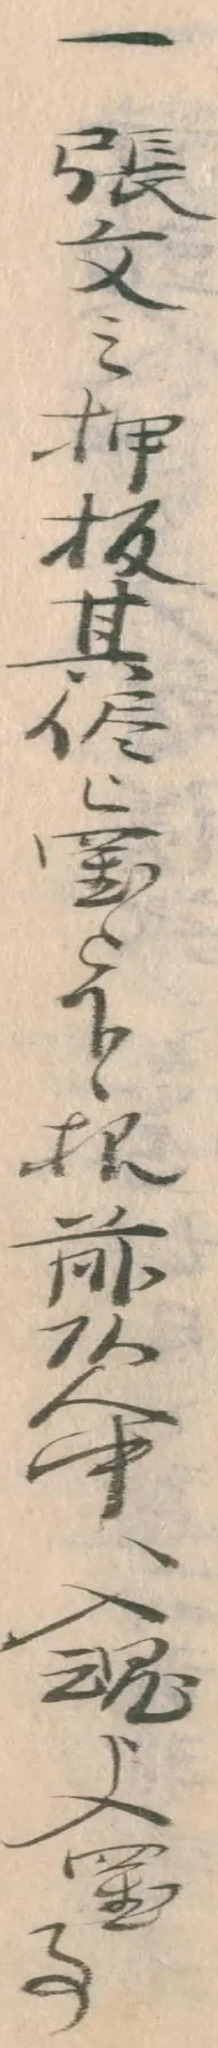一張文之押板其侭被置被下候様前頭人中へ入魂申入置事
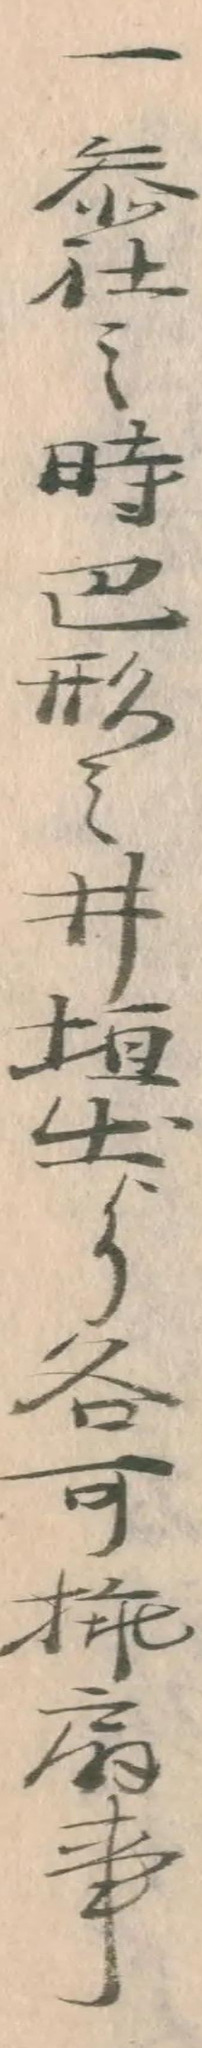一参社之時巴形之井垣出より各可挿扇事
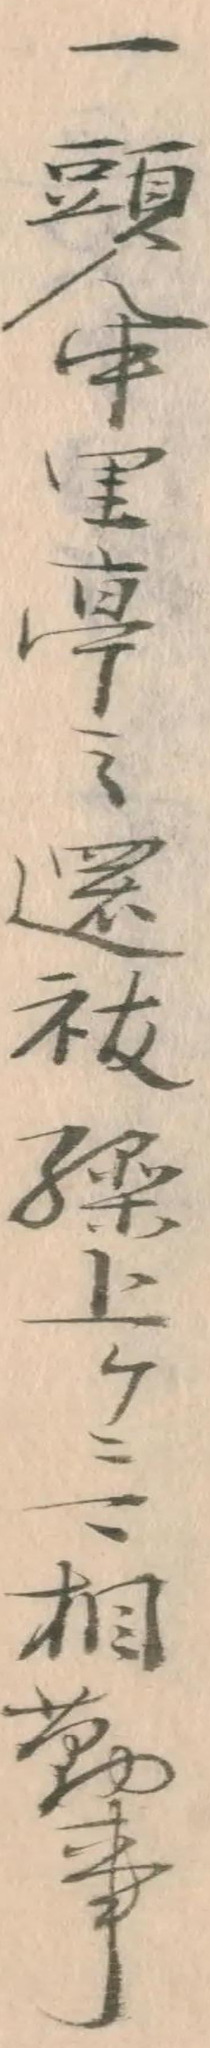一頭人中里亭之還祓被繰上ケニ可相勤事
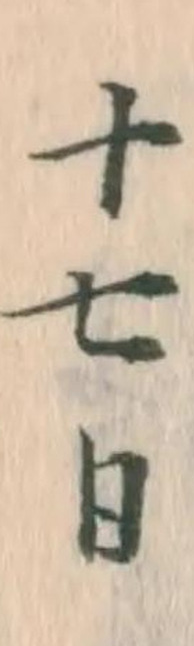十七日
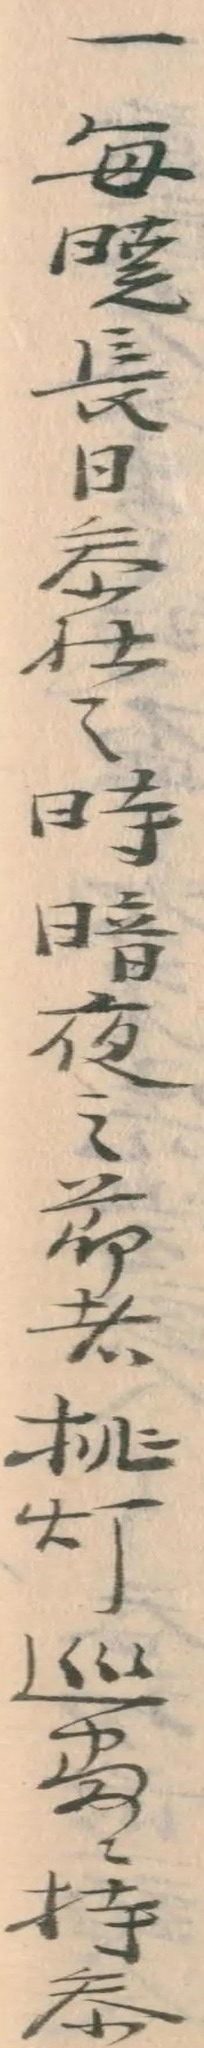一毎暁長日参社之時暗夜之節は挑灯巡番に持参
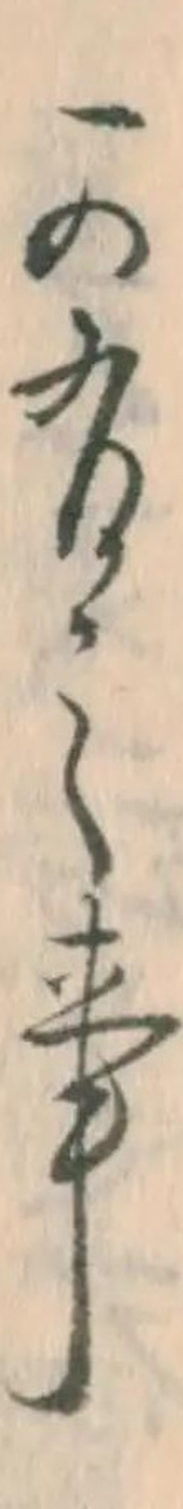可有之事
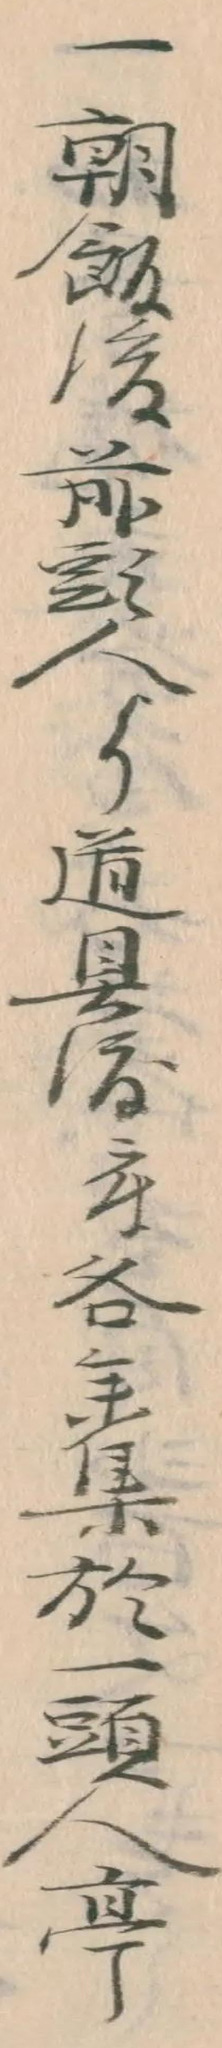一朝飯後前頭人より道具渡ニ付各参集於一頭人亭
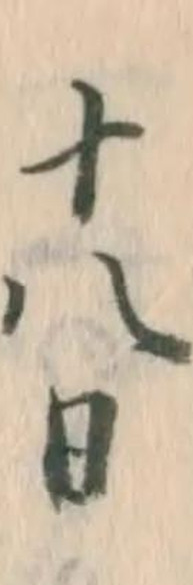十八日
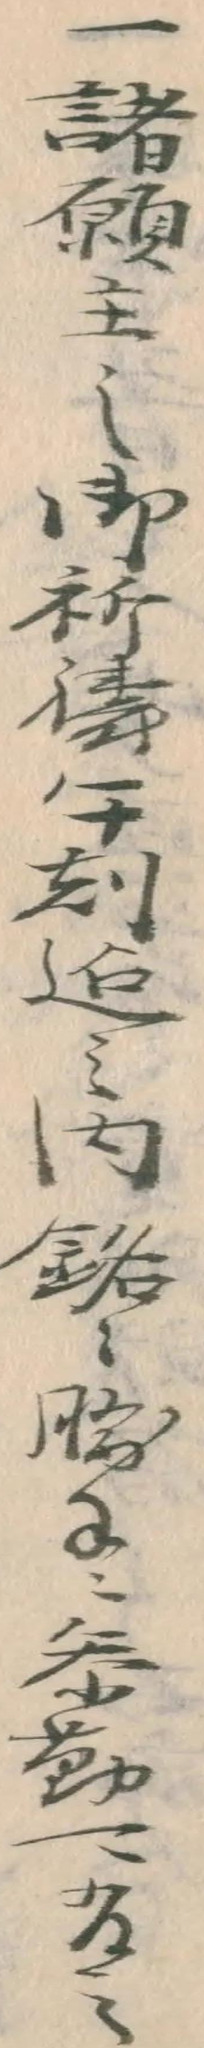一諸願主之御祈祷午刻迄之内銘々勝手ニ参勤可有之
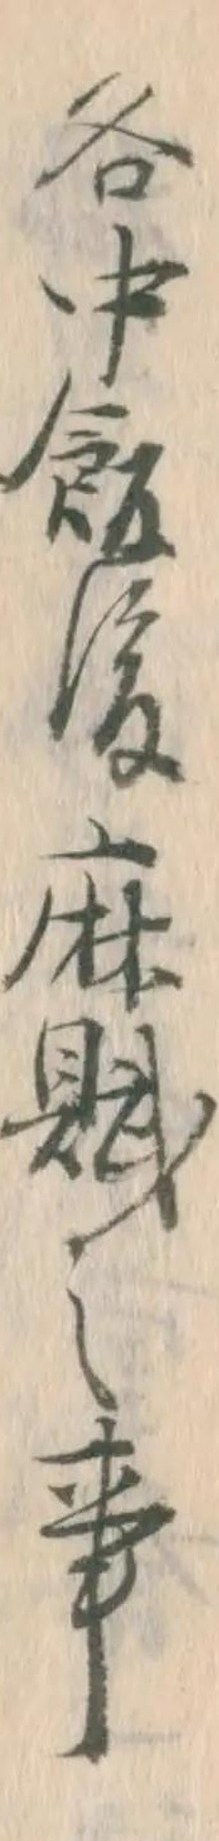各中飯後麻賦之事
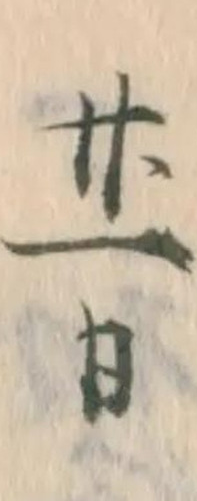廿一日
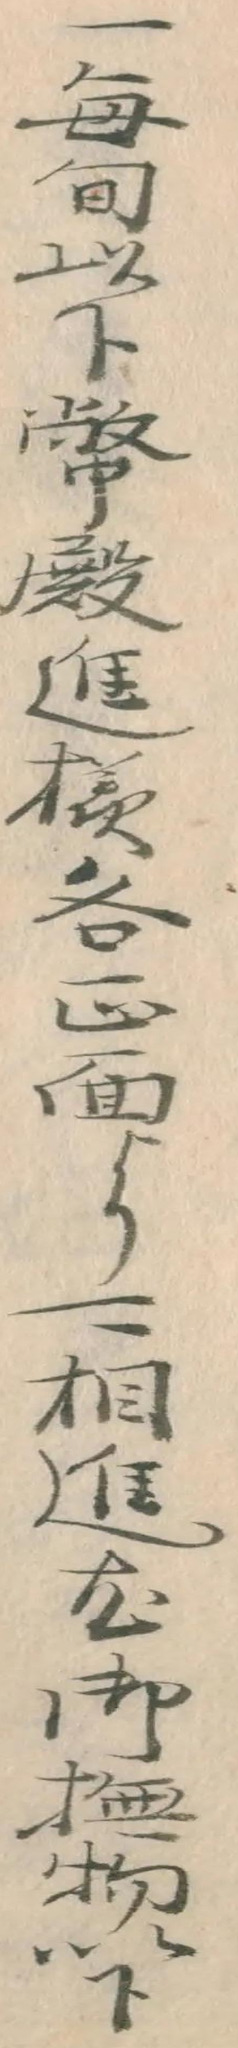一毎旬以下幣殿進様各正面より可相進尤御撫物以下
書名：賀茂社記録. 第72冊
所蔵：国立国会図書館 National Diet Library, JAPAN
